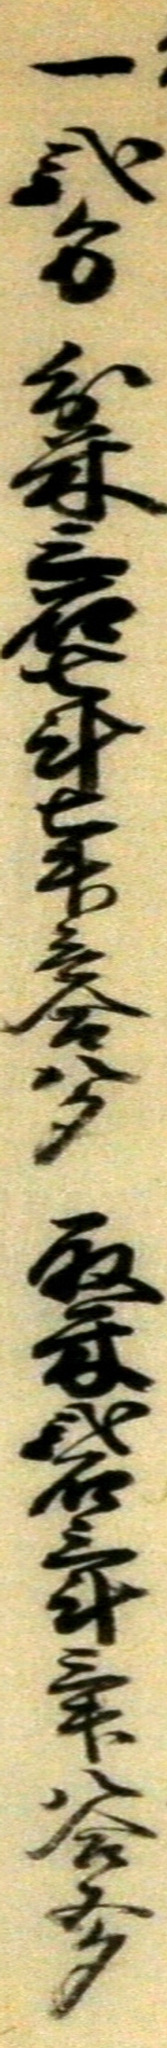一弐分分米三石七斗七升壱合八勺取米弐石三斗三升八合五勺
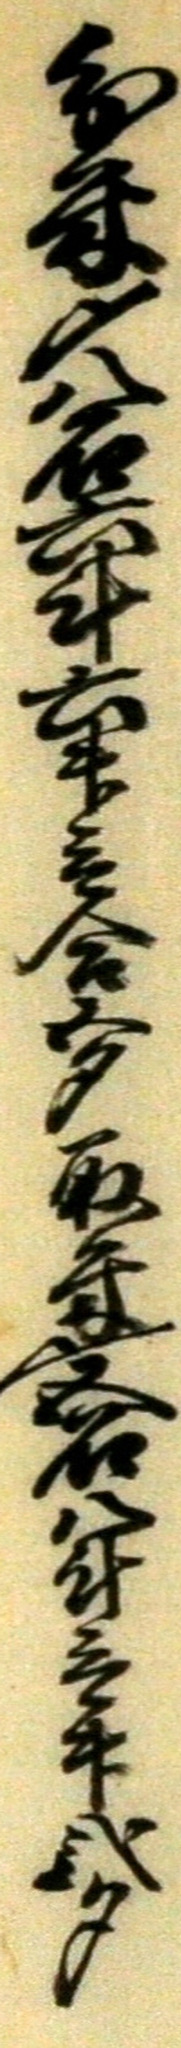分米〆八石六斗六升壱合五勺取米〆五石八斗壱升弐勺
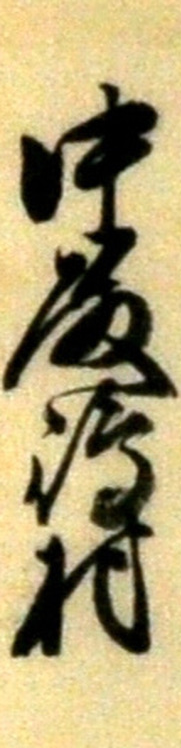中殿嶋村

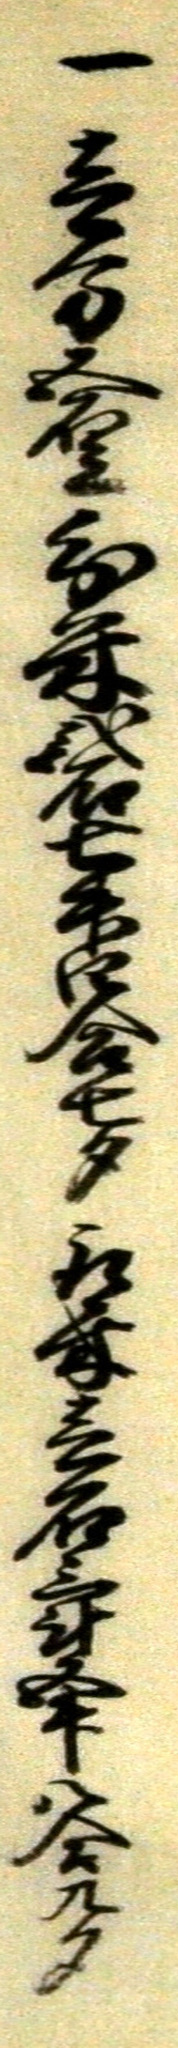一壱分五厘分米弐石七升四合七勺取米壱石三斗五升八合九勺
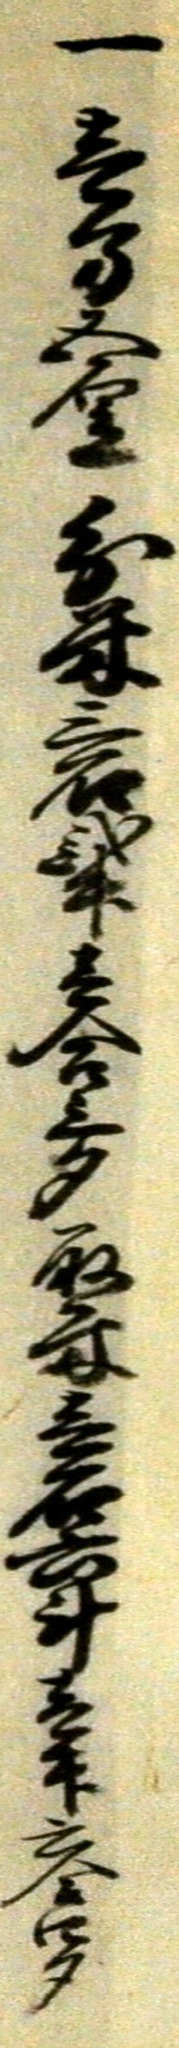一壱分五厘分米三石弐升壱合三勺取米壱石六斗壱升六合四勺
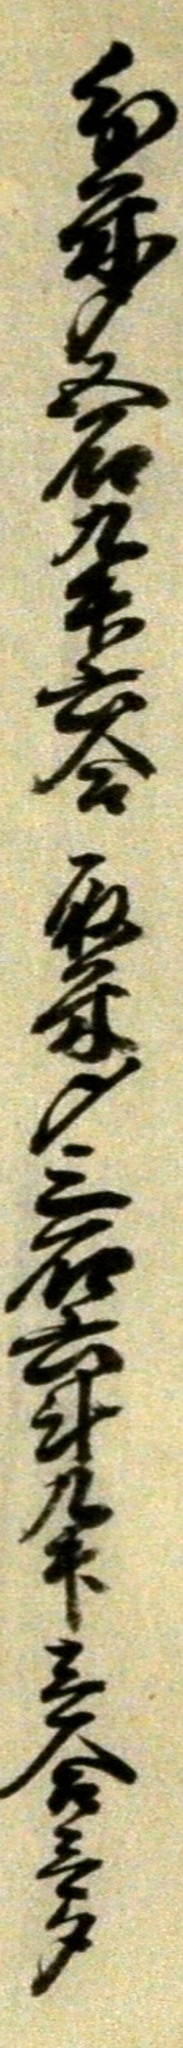分米〆五石九升六合取米〆三石六斗九升壱合壱勺
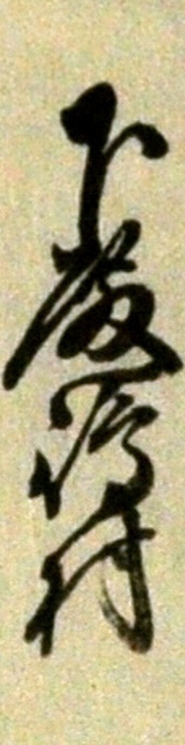下殿嶋村
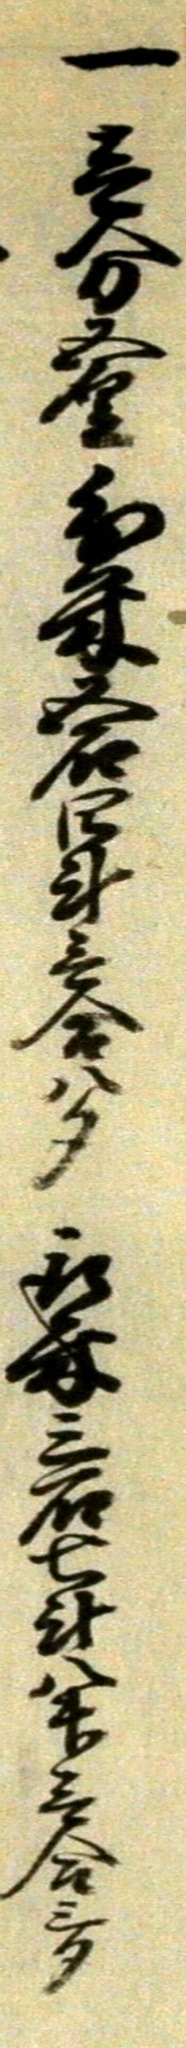一壱分五厘分米五石四斗壱合八勺取米三石七斗八升壱合三勺
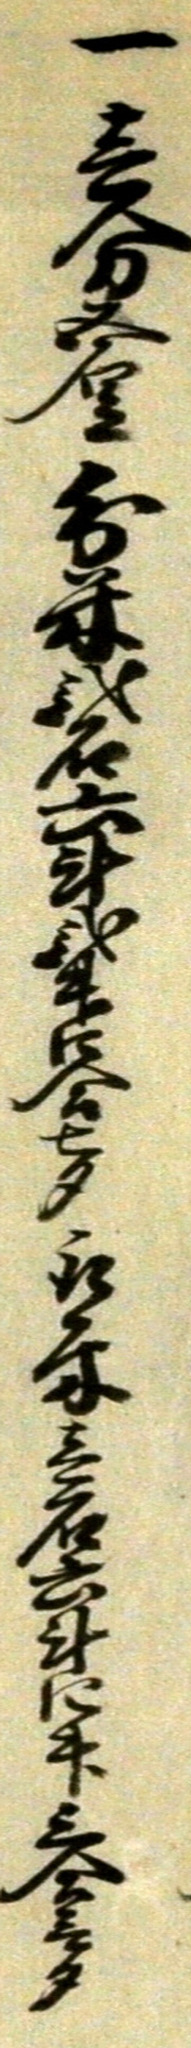一壱分五厘分米弐石六斗弐升四合七勺取米壱石六斗四升三合壱勺
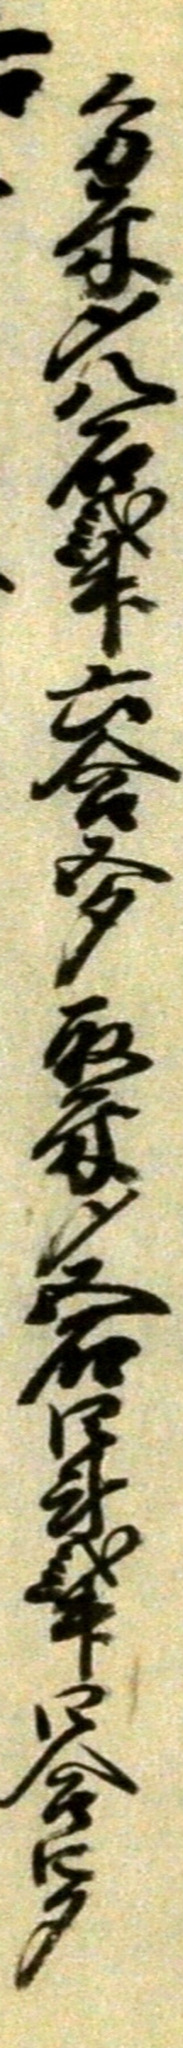分米〆八石弐升六合五勺取米五石四斗弐升四合四勺
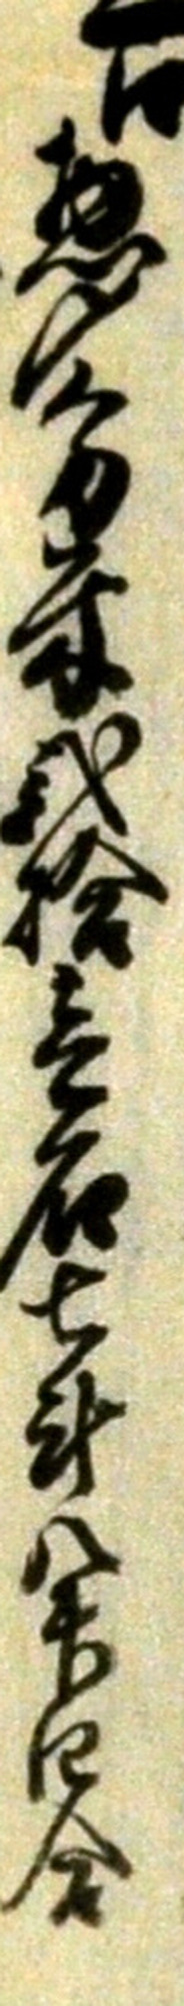惣〆分米弐拾壱石七斗八升四合
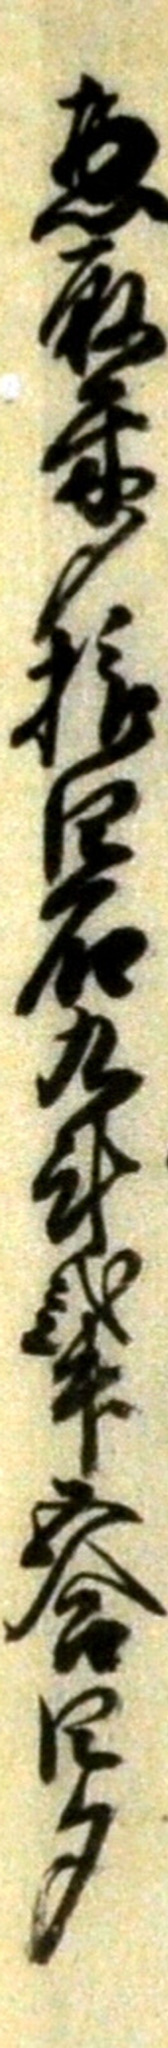惣取米〆拾四石九斗弐升五合四勺
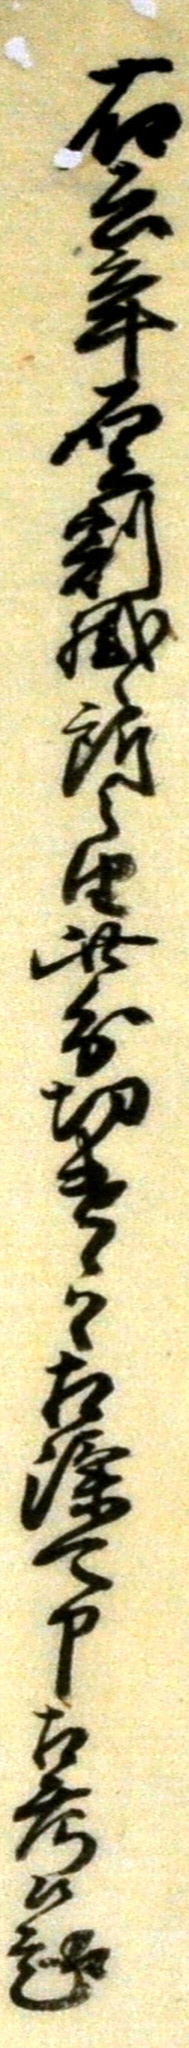右去年厘割掛候所之由此分切遣候ハヽ相済可申相考候趣
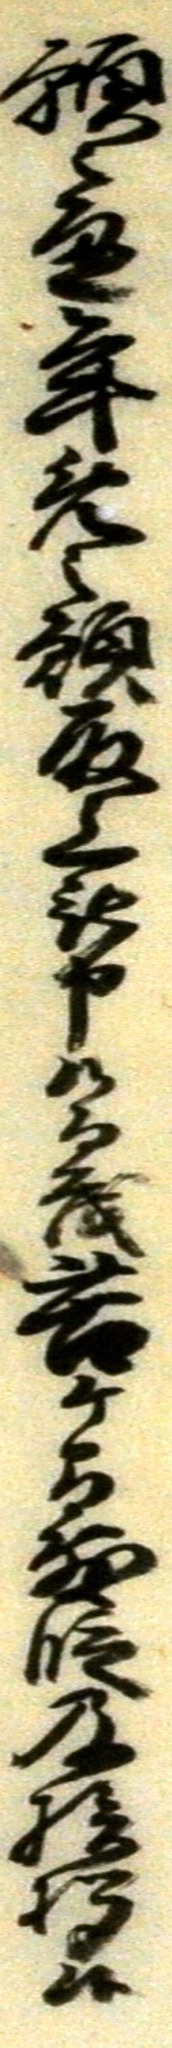願之通年免之願取上被申候而茂苦ヶ間敷段及挨拶候
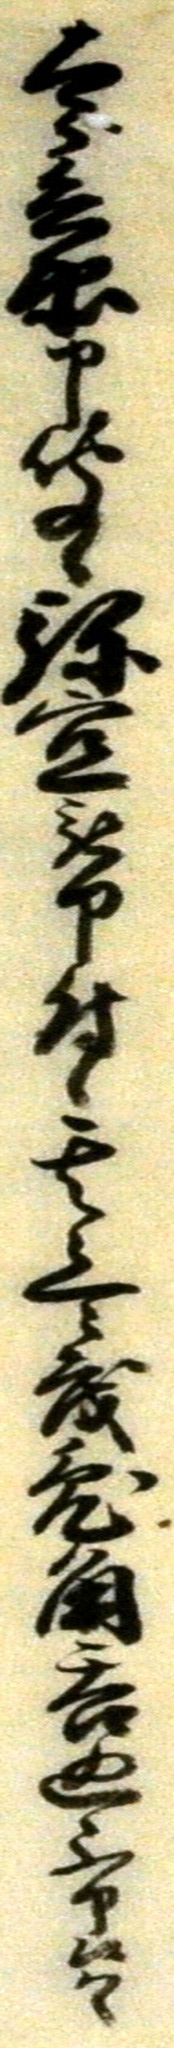太郎兵衛申聞候弥宜被申付候其上ニ茂兎角呑込不申候ハヽ
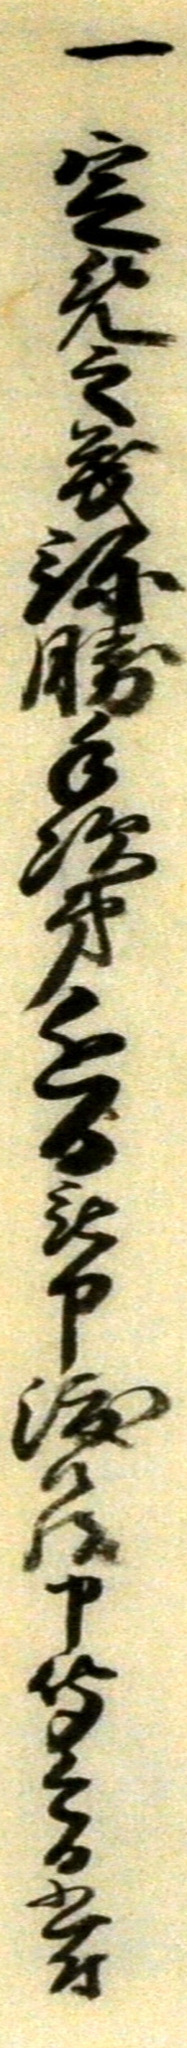一定免之義弥勝手次第近日被申渡候様申聞今日書付
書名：留書
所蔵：伊那市立高遠町図書館・合同会社AMANE
